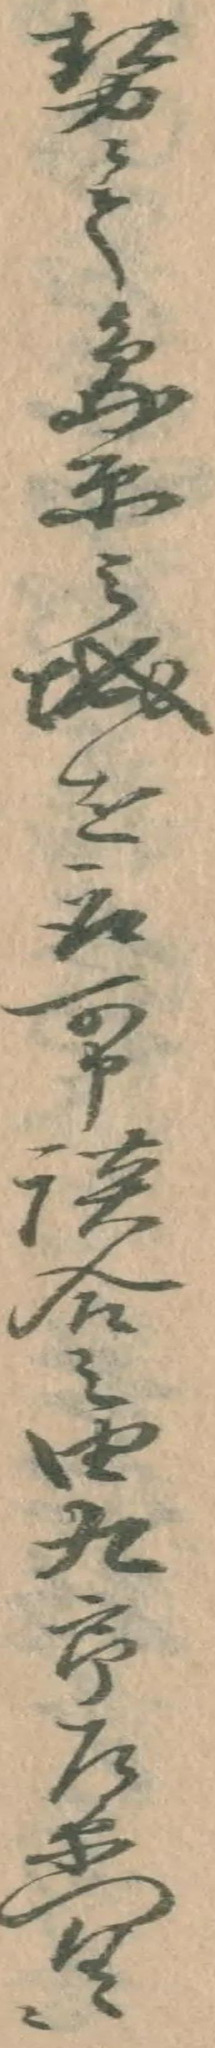勢にて島原之城を取可申談合之由九郎左衛門具に
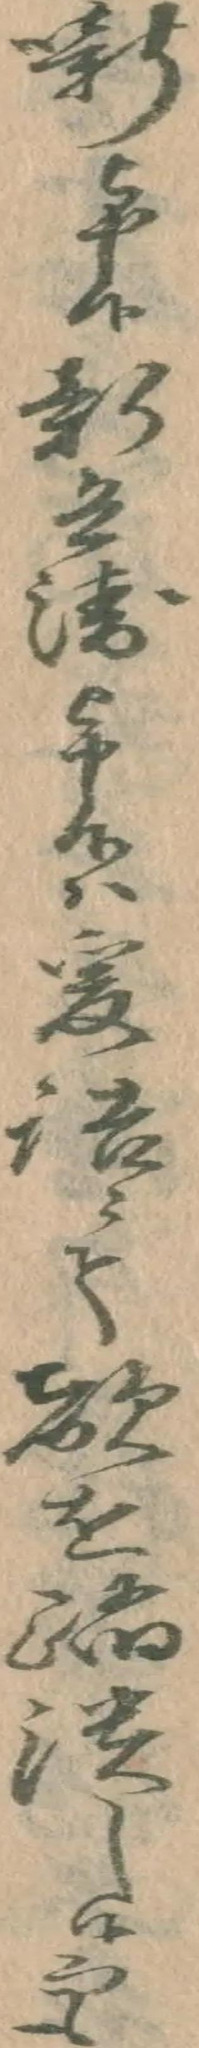噺被申候新兵衛被申候は爰詰にて敵を踏潰し候而も
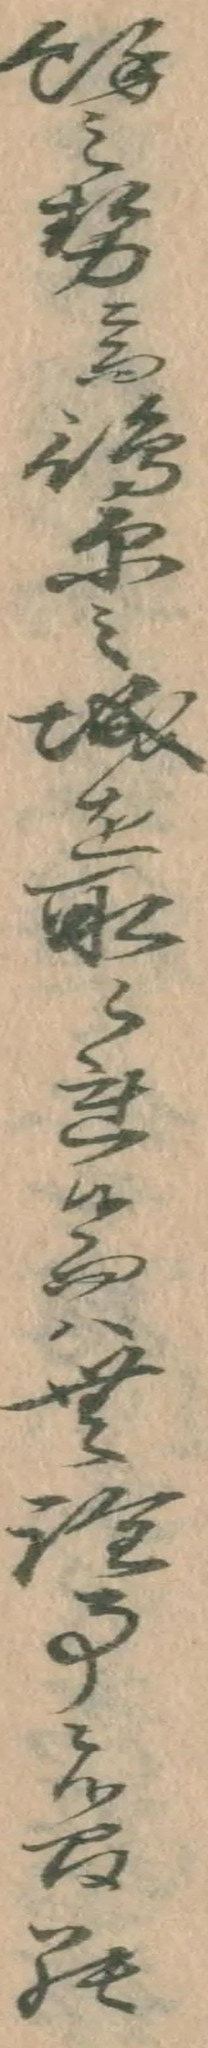余之勢に而島原之城を取られ候而は無詮事に候間罷
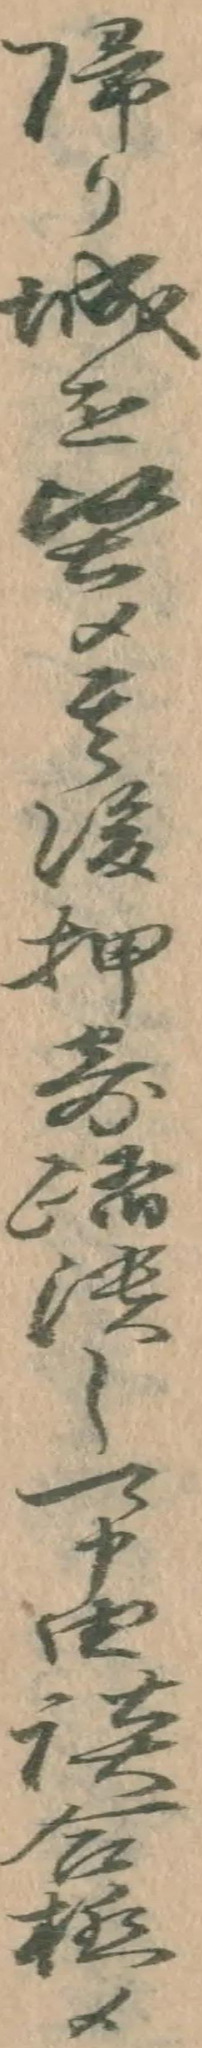帰り城を堅め其後押寄踏潰し可申由談合極〆？
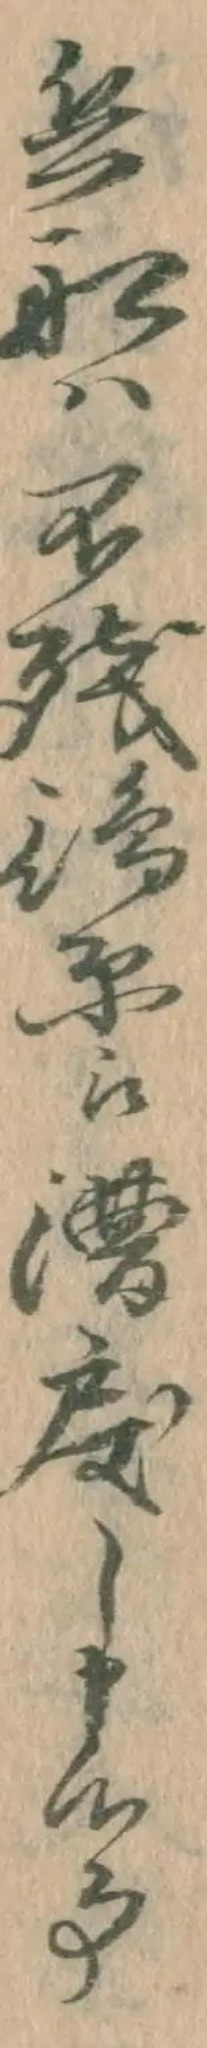兵船は不残島原え漕戻し申候事
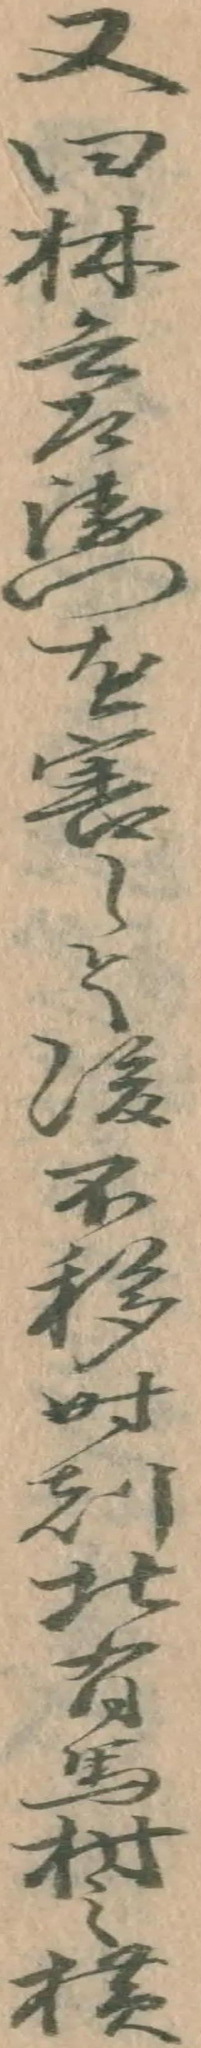又日林兵左衛門を害して後不移時刻北有馬村之横
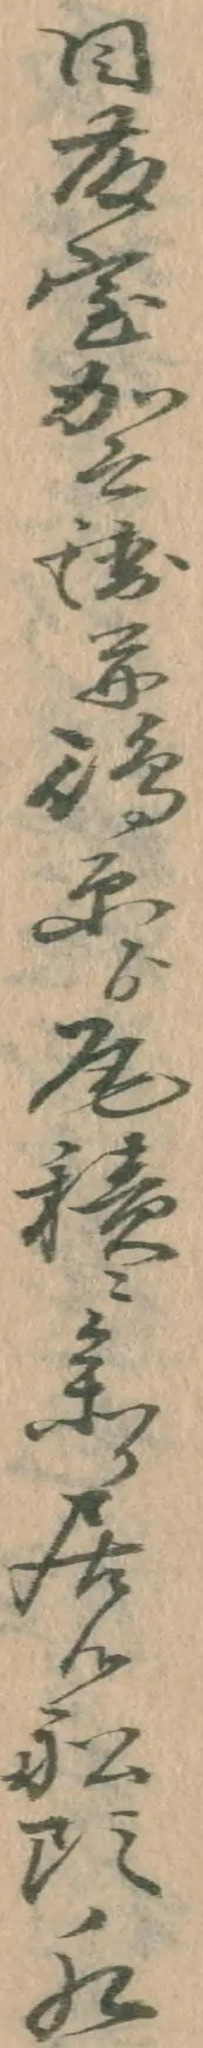目殿宝加兵衛並并島原ゟ瓦積に参り居候船頭水
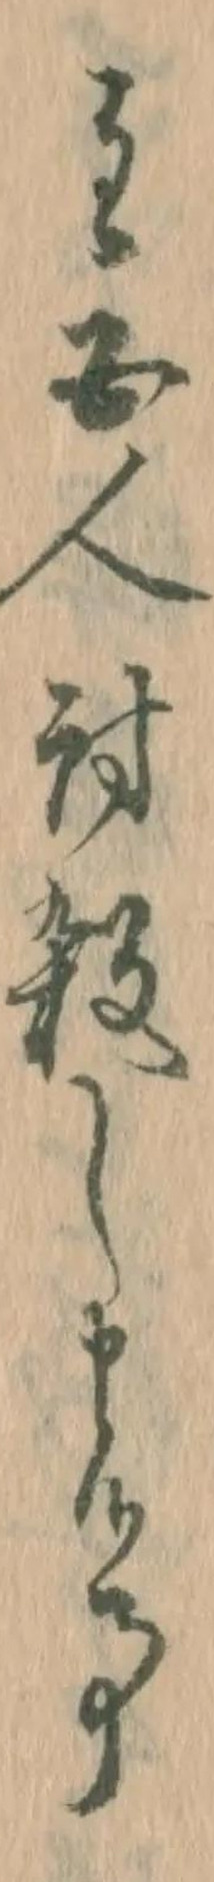主五人討殺し申候事
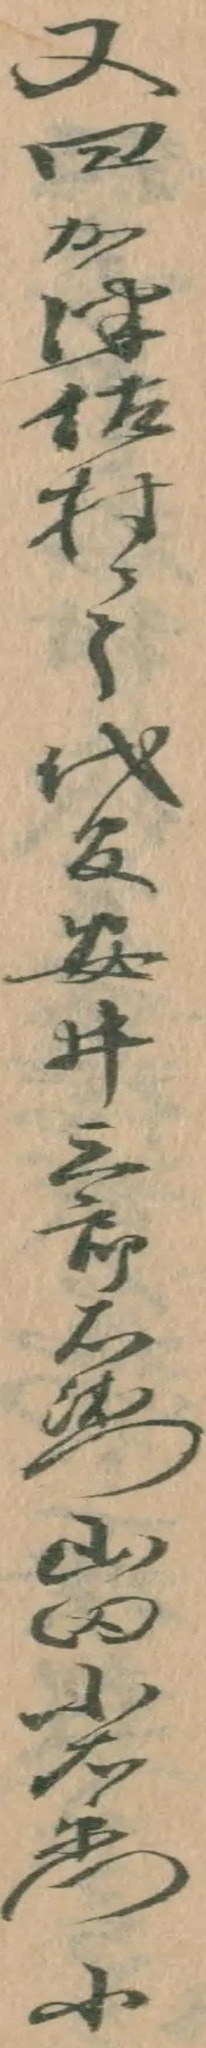又日加津佐村にて代官安井三郎右衛門山田小右衛門小
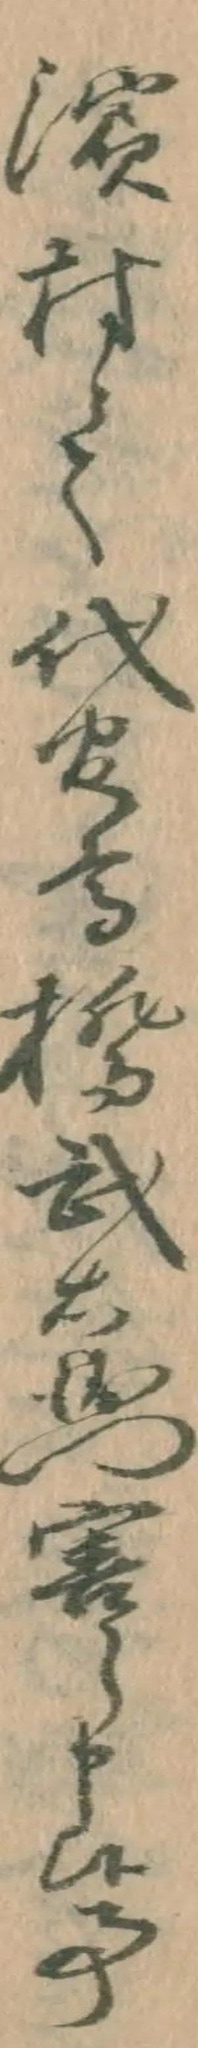浜村にて代官高橋武右衛門害し申候事
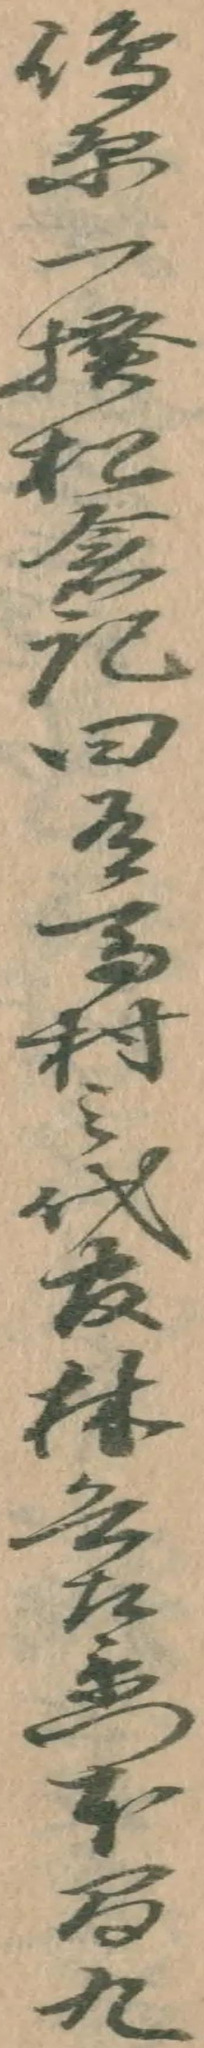島原一揆松倉記日有馬村之代官林兵左衛門本間九
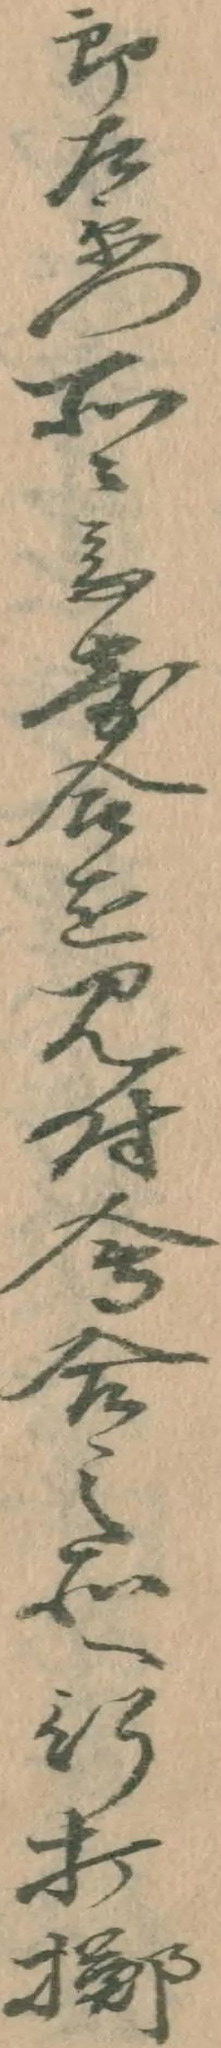郎左衛門所々に而寄合を見付会合之所へ行打擲
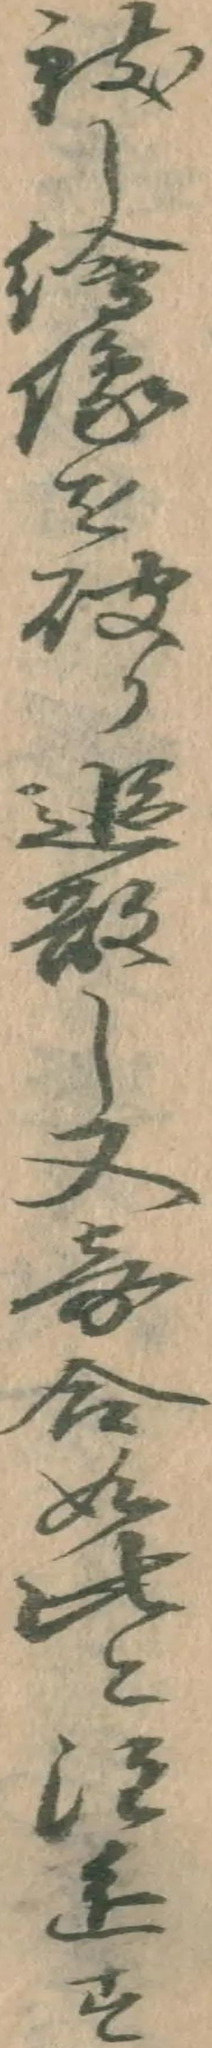致し絵像を破り追散し又寄合如此と注進す
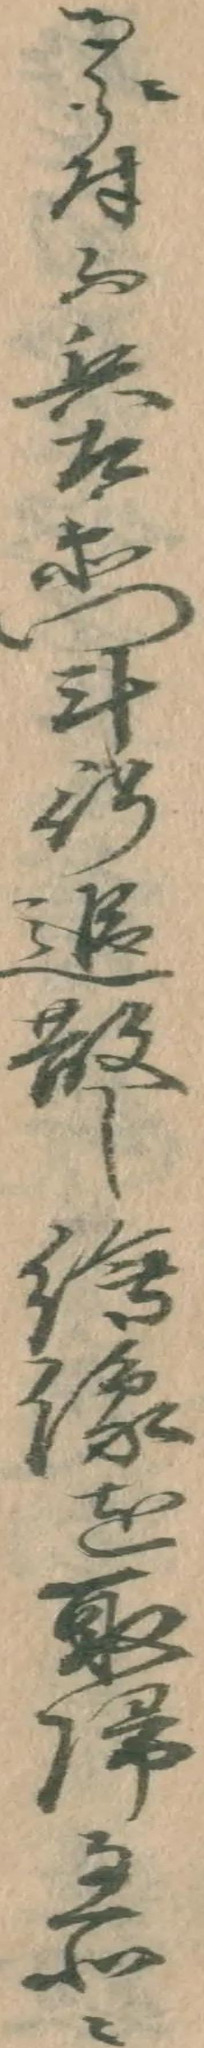るに付而兵左衛門斗行追散し絵像を取帰る所に
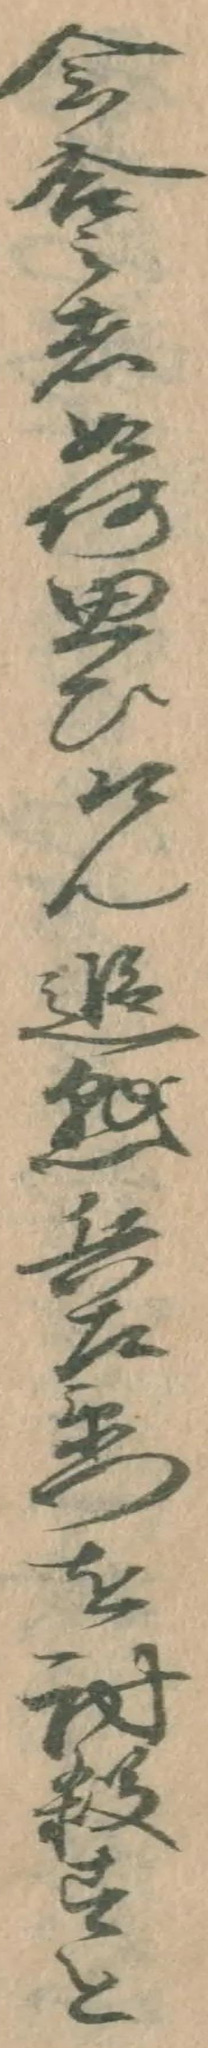会合之者如何思ひけん追懸兵左衛門を討殺すと
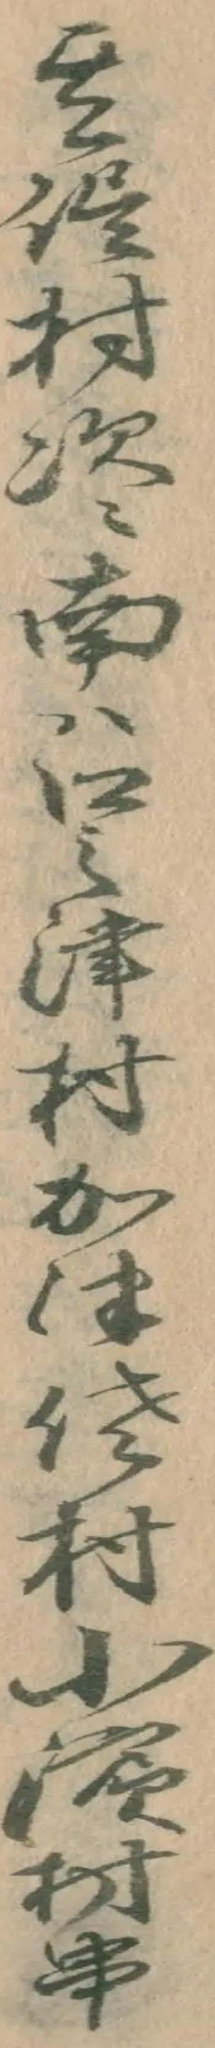其侭村次に南は口之津村加津佐村小浜村串
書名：切支丹御退治記 49巻. [1]
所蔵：国立国会図書館 National Diet Library, JAPAN
